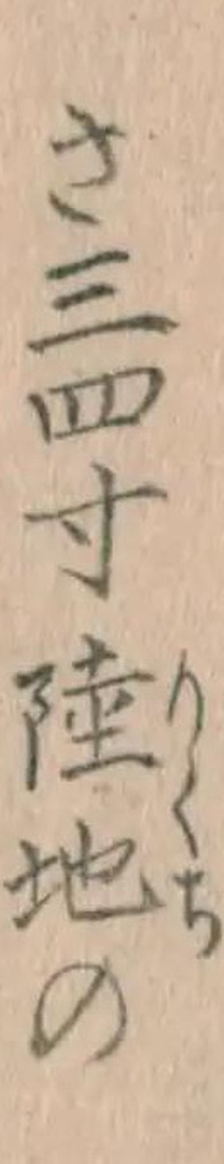さ三四寸陸地の
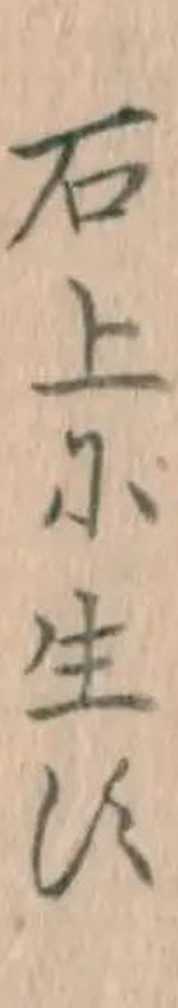石上に生す
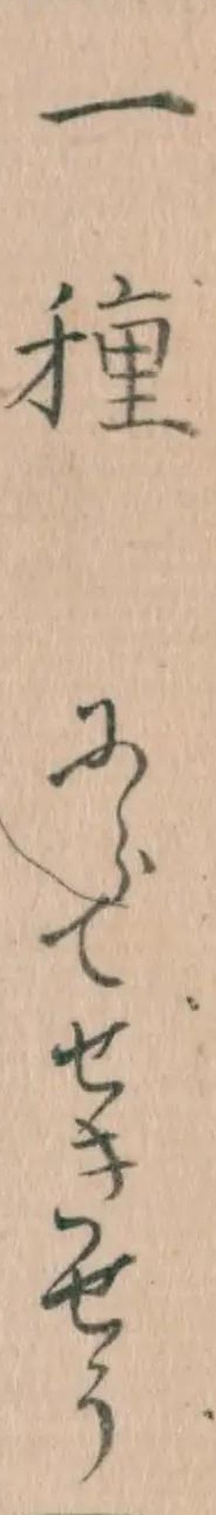一種にらてせきせう
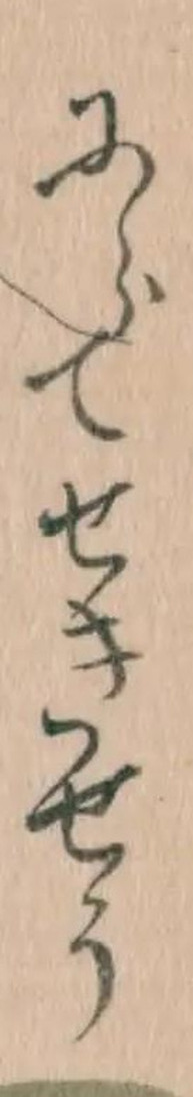にらてせきせう
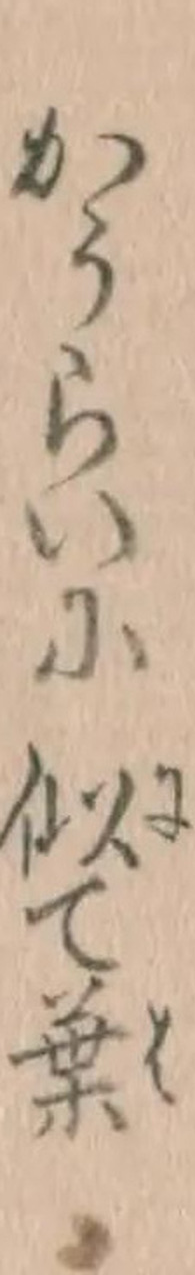かうらいに似て葉
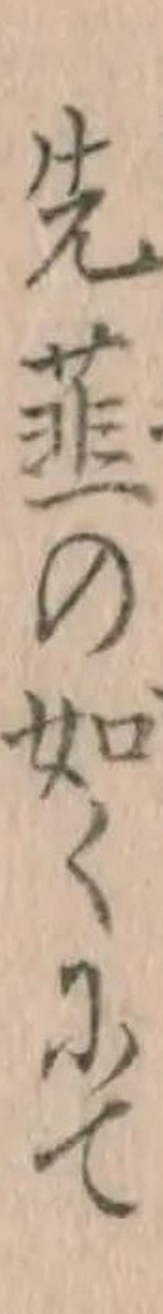先韮の如くにて
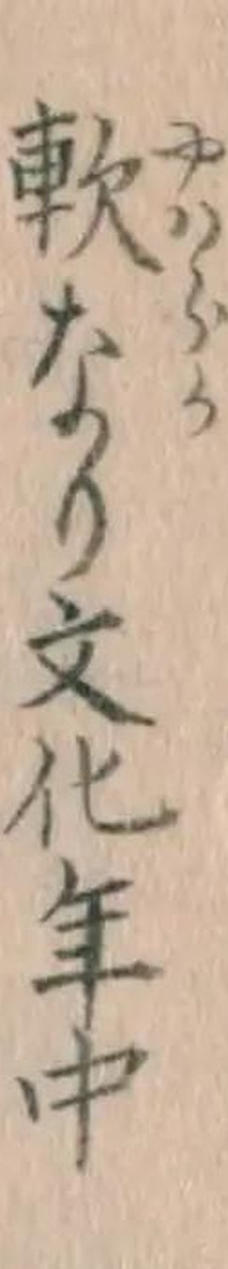軟なり文化年中
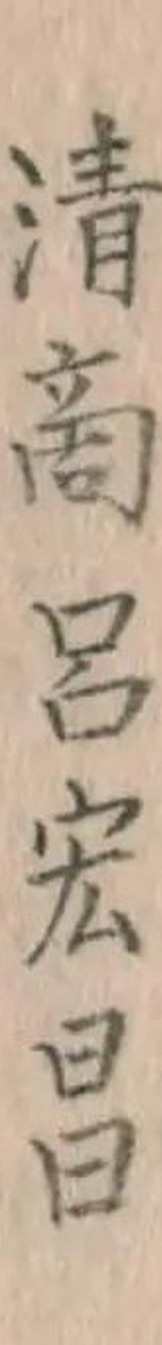清商呂宏昌
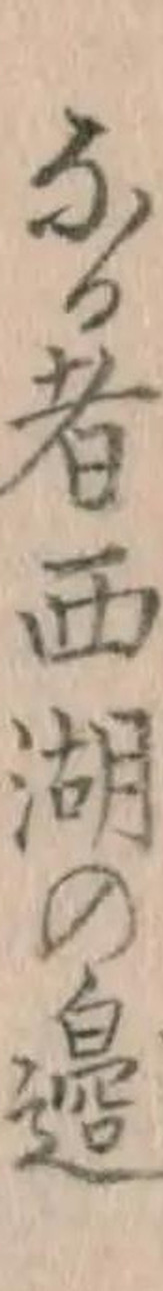なる者西湖の辺
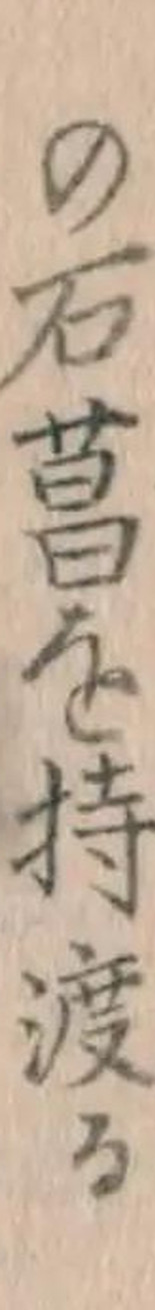の石菖を持渡る
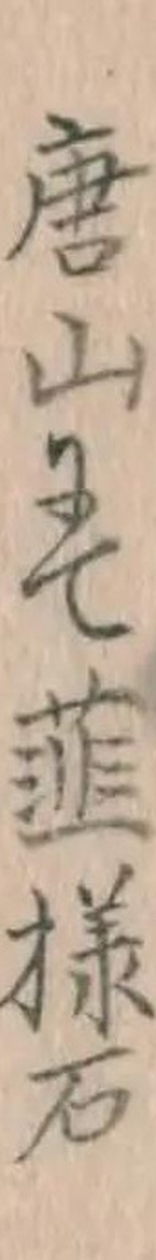唐山にて韮様石
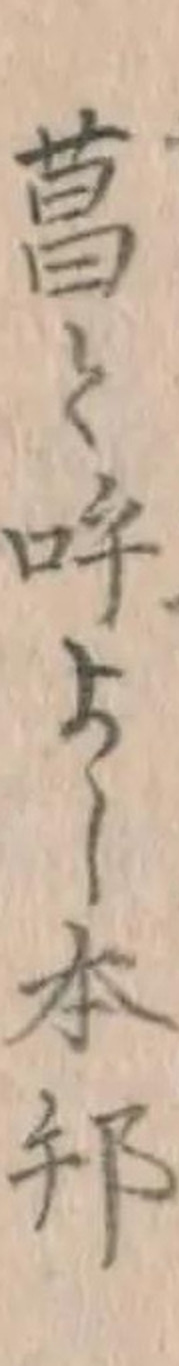菖と呼よし本邦
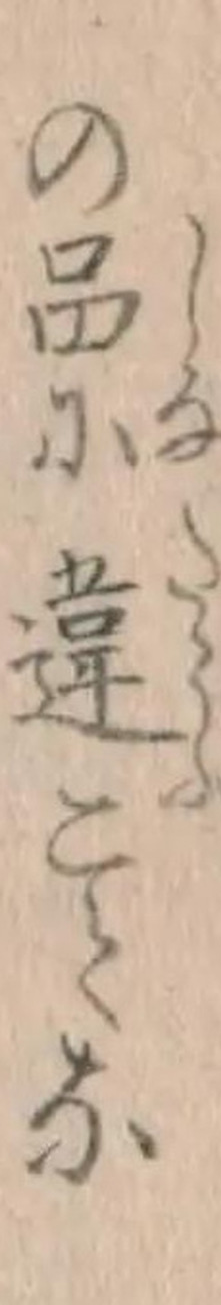の品に違ことな
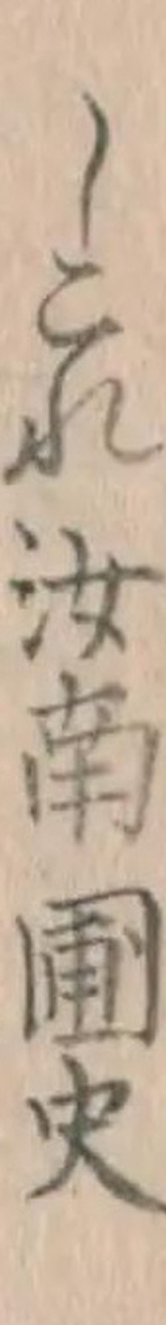しこれ汝南圃史
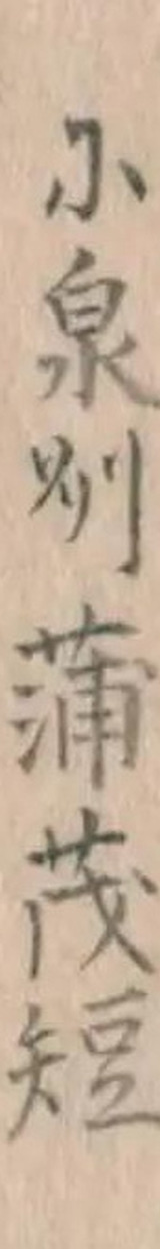に泉州蒲茂短
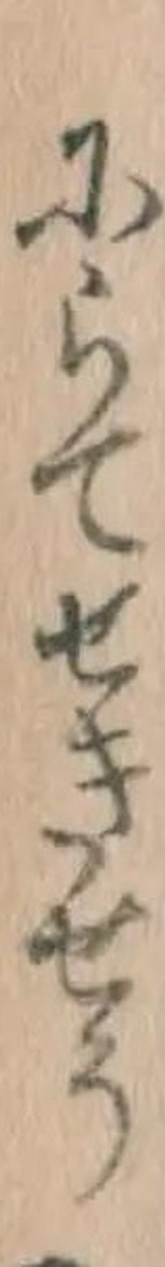にらてせきせう
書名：本草図譜. 巻31-33
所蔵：国立国会図書館 National Diet Library, JAPAN
